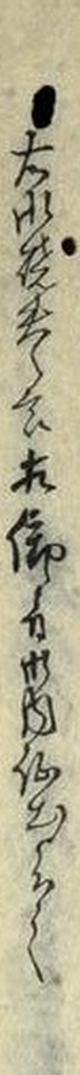右御焼失之節相働候ニ付御内証出被下之

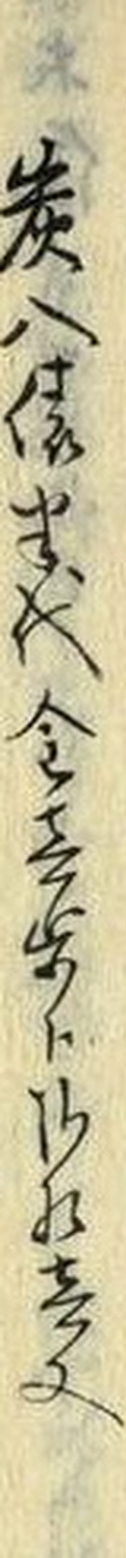炭八俵半代金壱歩ト弐拾壱文
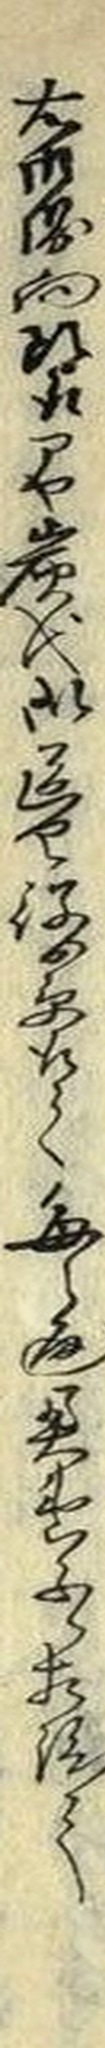右御側向頭取部屋炭代御道具役ゟ受取之毎之通奥台子へ相渡之
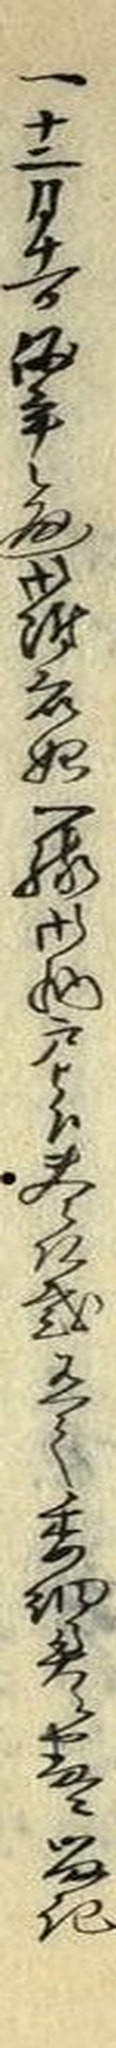一十二月十一日例年之通御附衆始一統御納戸被下夫々頂戴有之委細奥之番留記
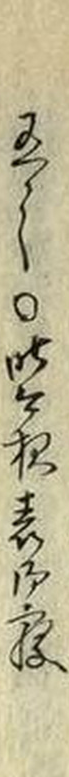有之〇昨今夜表御寝
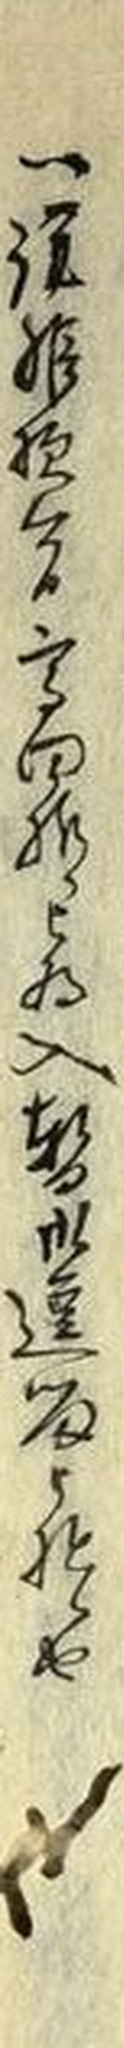一謹姫様今日高田様へ被為入暫御逗留被遊候由
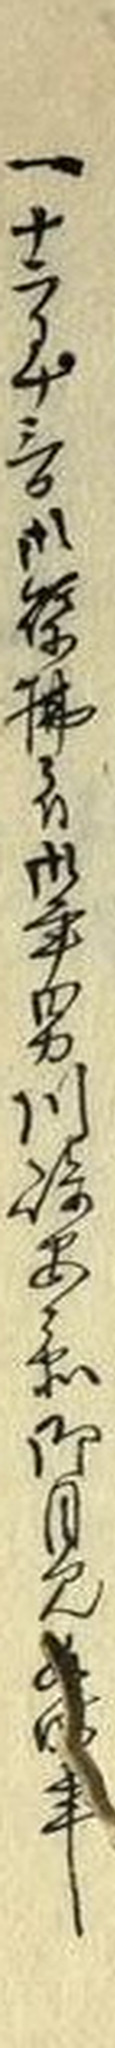一十二月十三日御煤払ニ付御年男川崎安兵衛御目見事
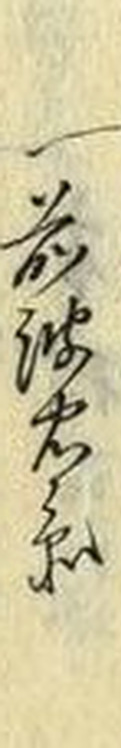前波忠兵衛
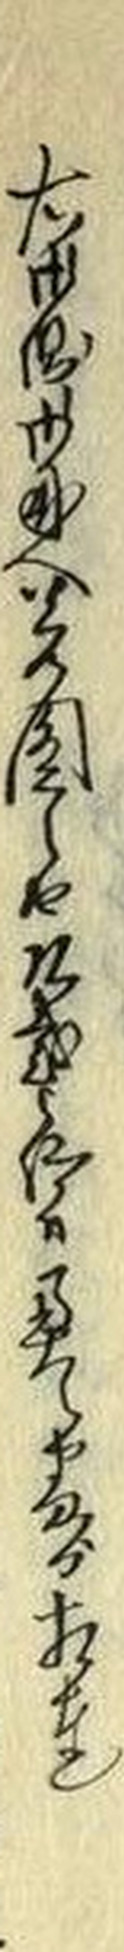右御側御用人差図之由頂戴被仰付奥之番ゟ相達
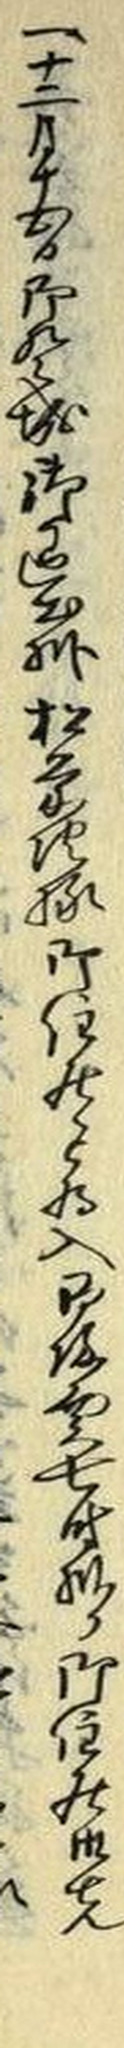一十二月十五日御登城御退出掛松栄院様御住居へ被為入御帰殿七時掛り御住居御先
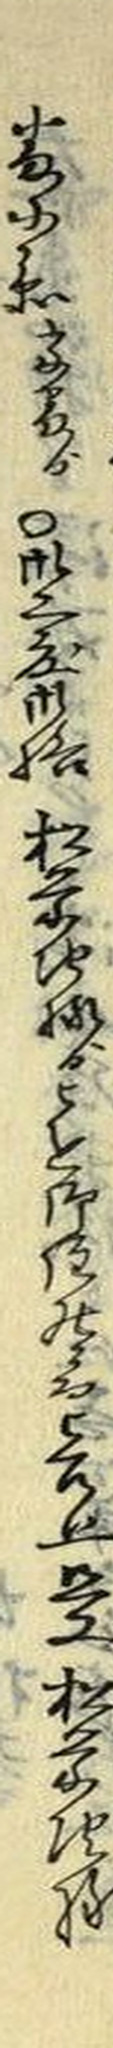番小兵衛当番ゟ〇御二度御膳松栄院様ゟ被進御住居ニ而被召上且又松栄院様
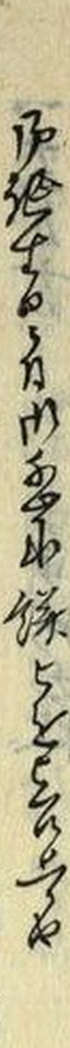御誕生日ニ付御千歳餅被進被召上候由
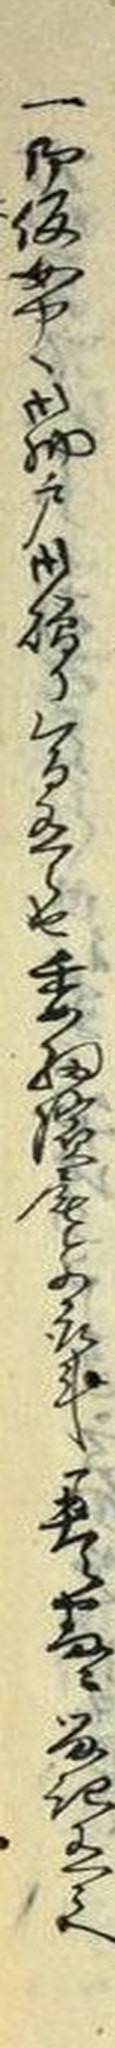一御仮女中へ御納戸御贈り今日有之由委細浜尾との取計奥之番ニ留記有之
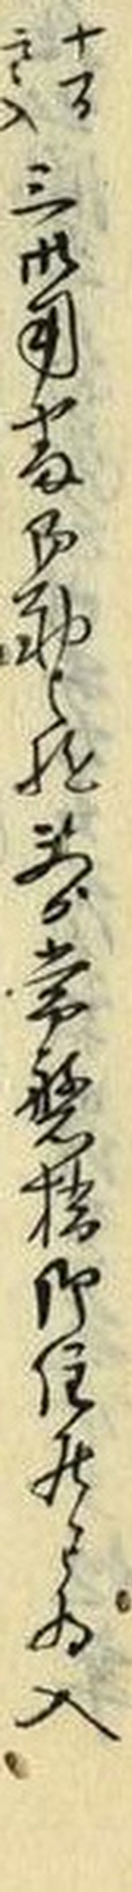寒入三御用番御勤被遊夫ゟ常盤橋御住居へ被為入
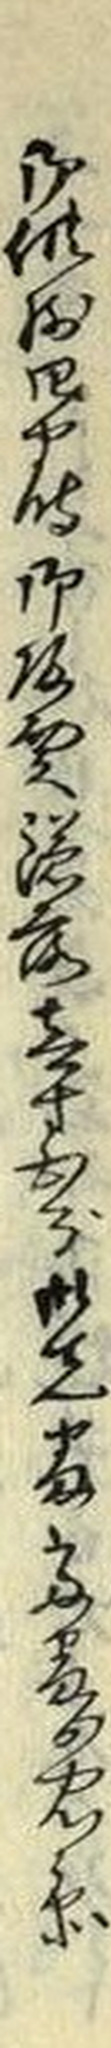御供揃四半時御帰殿鎌落壱寸五分御先番当番ゟ忠兵衛
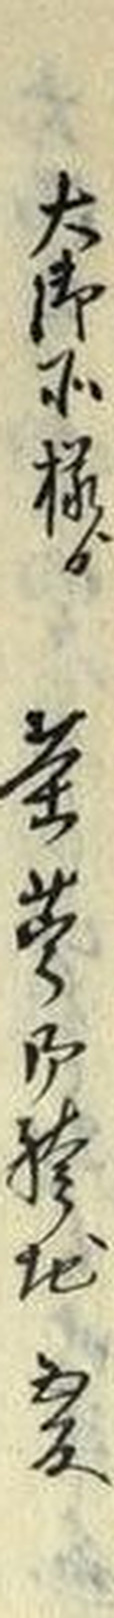大御所様ゟ茶苧御袴地五反
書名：少傅日録抄（斉善付側向頭取日記、在府）
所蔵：福井県文書館 Fukui Prefectural Archives
